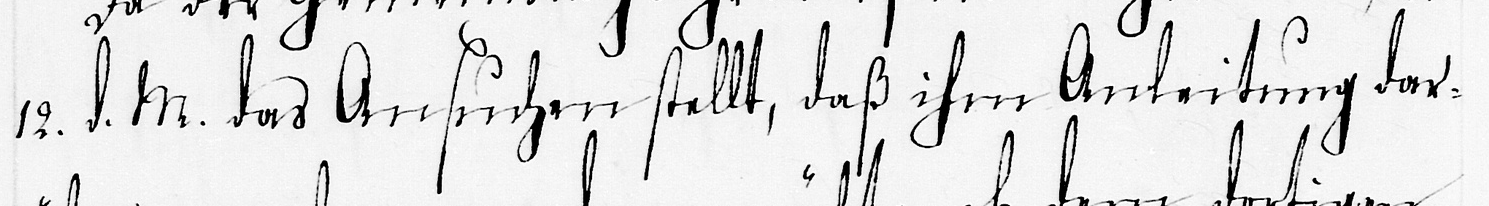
d. M. das Ansuchen stellt, daß ihm Anleitung dar¬
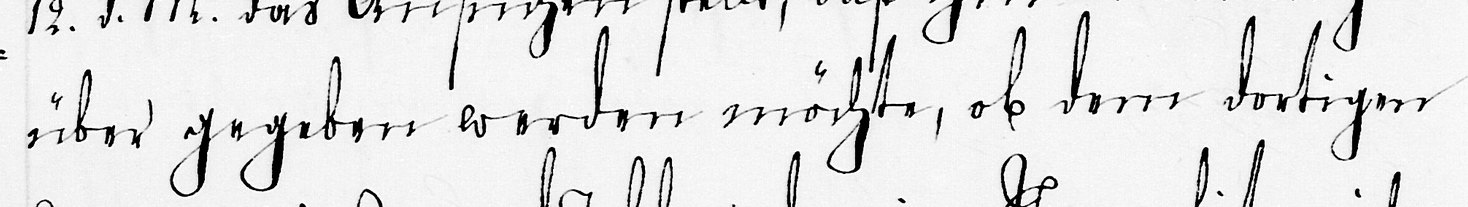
über gegeben werden möchte, ob dem dortigen
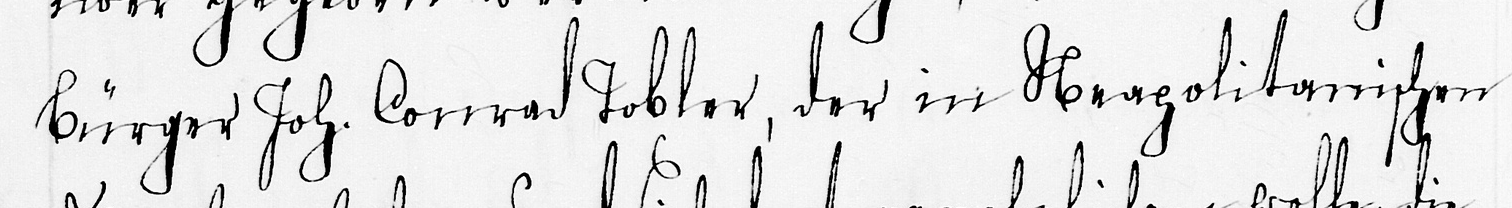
Bürger Joh. Conrad Tobler, der in Neapolitanischen
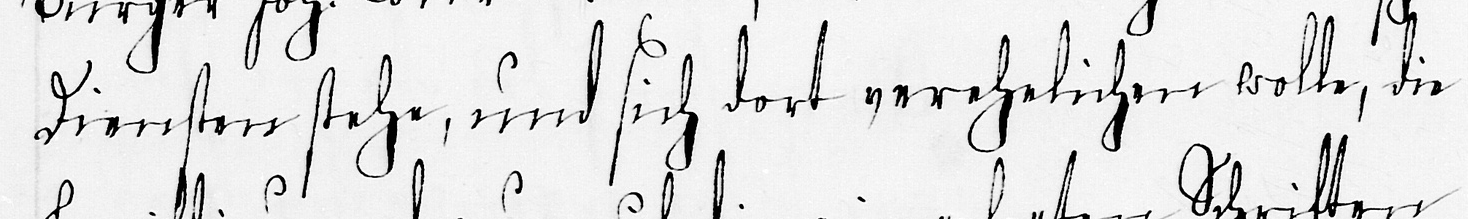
Diensten stehe, und sich dort verehelichen wolle, die
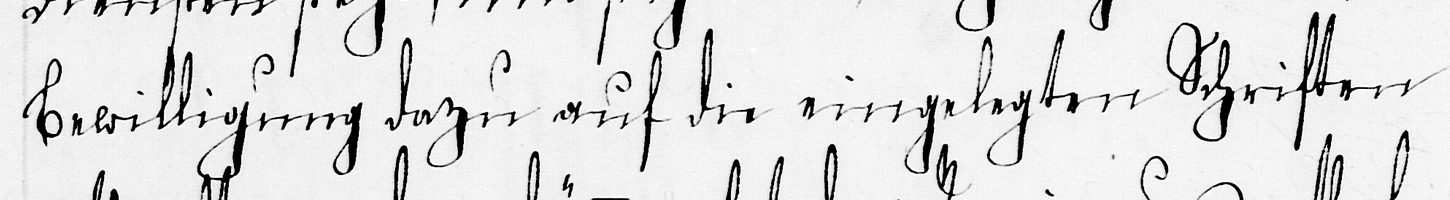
Bewilligung dazu auf die eingelegten Schriften
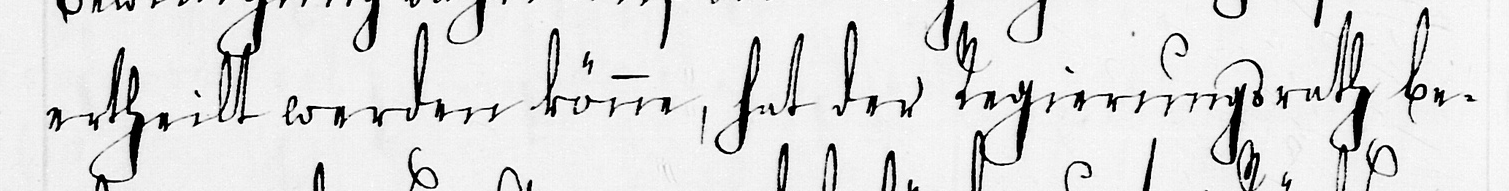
ertheilt werden könne, hat der Regierungsrath be¬
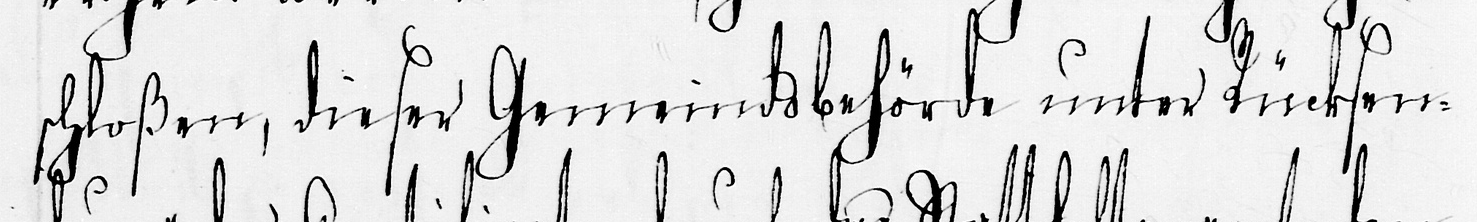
schloßen, dieser Gemeindsbehörde unter Rücksen¬
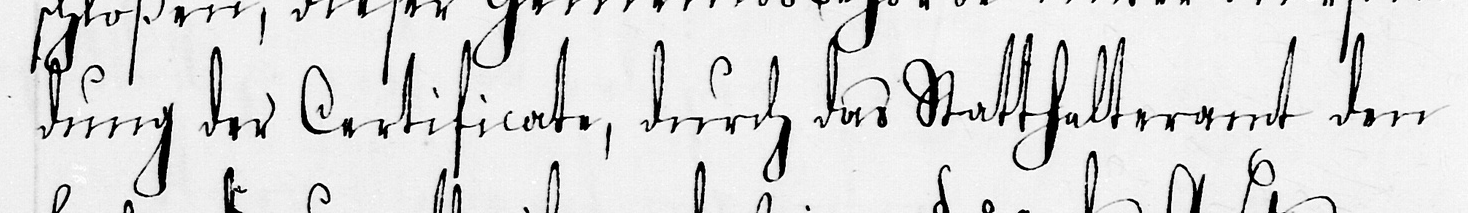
dung der Certificate, durch das Statthalteramt den
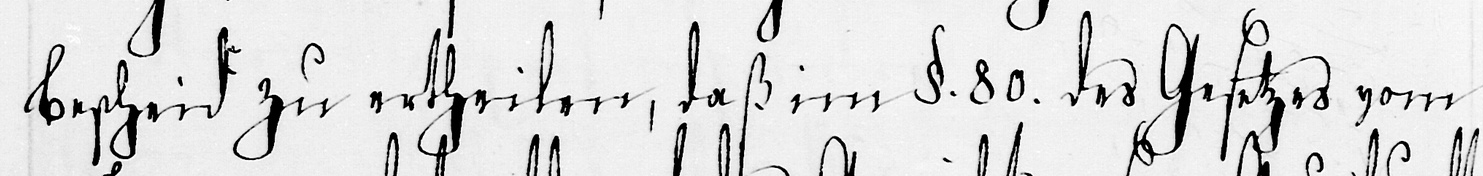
Bescheid zu ertheilen, daß im §. 80. des Gesetzes vom
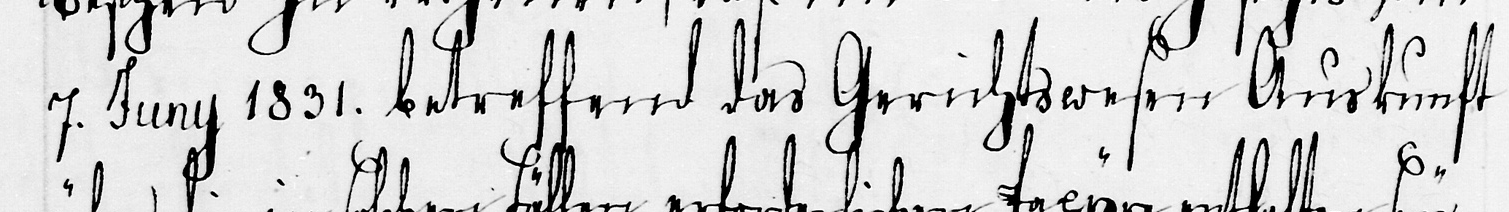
7. Juny 1831. betreffend das Gerichtswesen Auskunft
